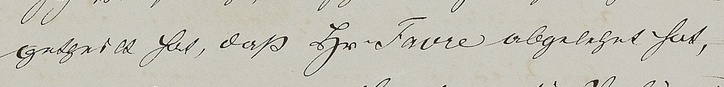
getheilt hat, daß Hr. Favre abgelehnt hat,
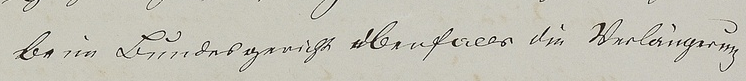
beim Bundesgericht ebenfalls die Verlängerung
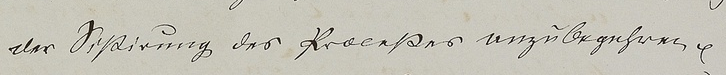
der Sistirung des Proceßes anzubegehren &
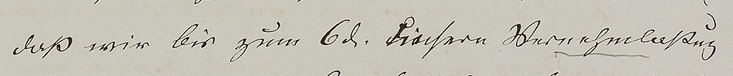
daß wir bis zum 6 d. unsere Vernehmlaßung
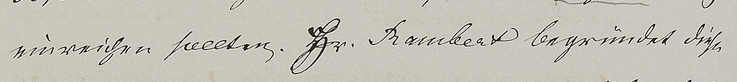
einreichen sollten. Hr. Rambert begründet diese
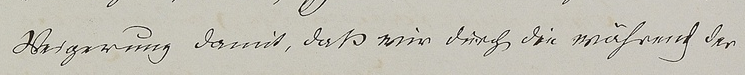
Weigerung damit, daß wir durch die während der
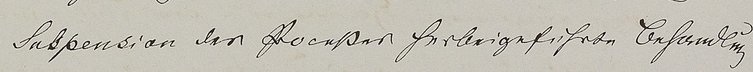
Suspension des Proceßes herbeigeführte Behandlung
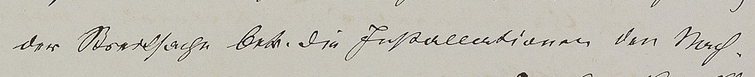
der Streitsache betr. die Installationen den Nach-
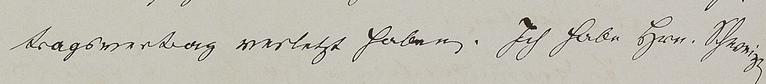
tragsvertrag verletzt haben. Ich habe Hrn. Schweizer
